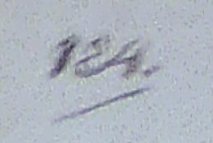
124.
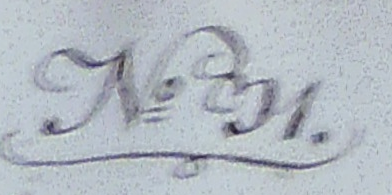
No͇ 31.
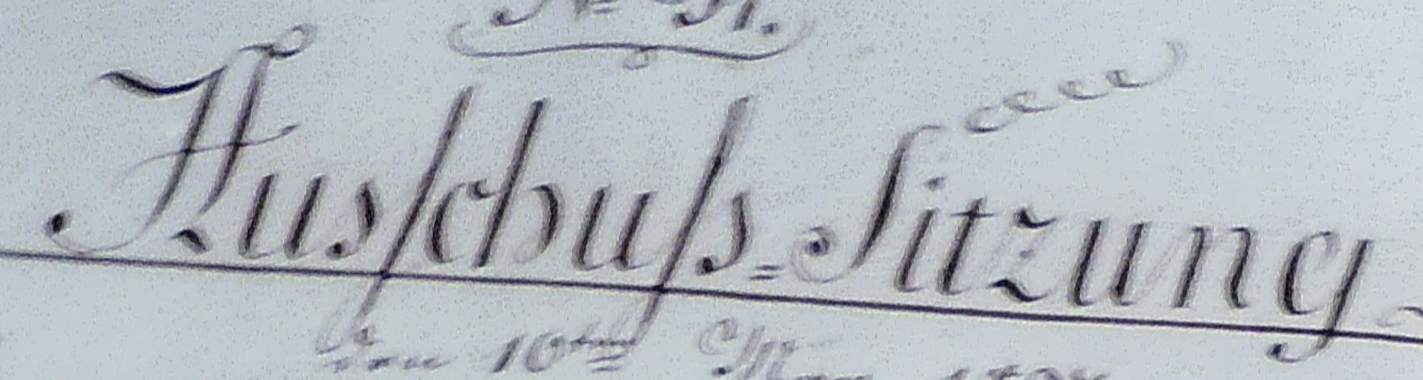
Ausschuss‗Sitzung
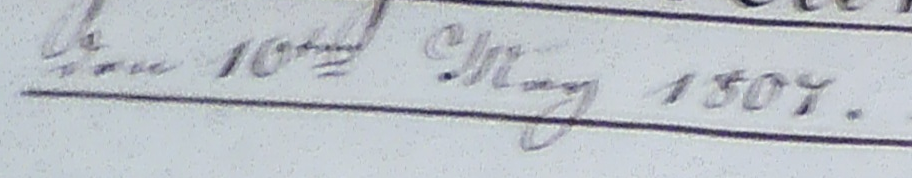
den 10te͇n May 1807.
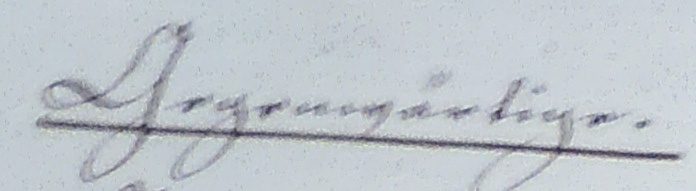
Gegenwärtige.
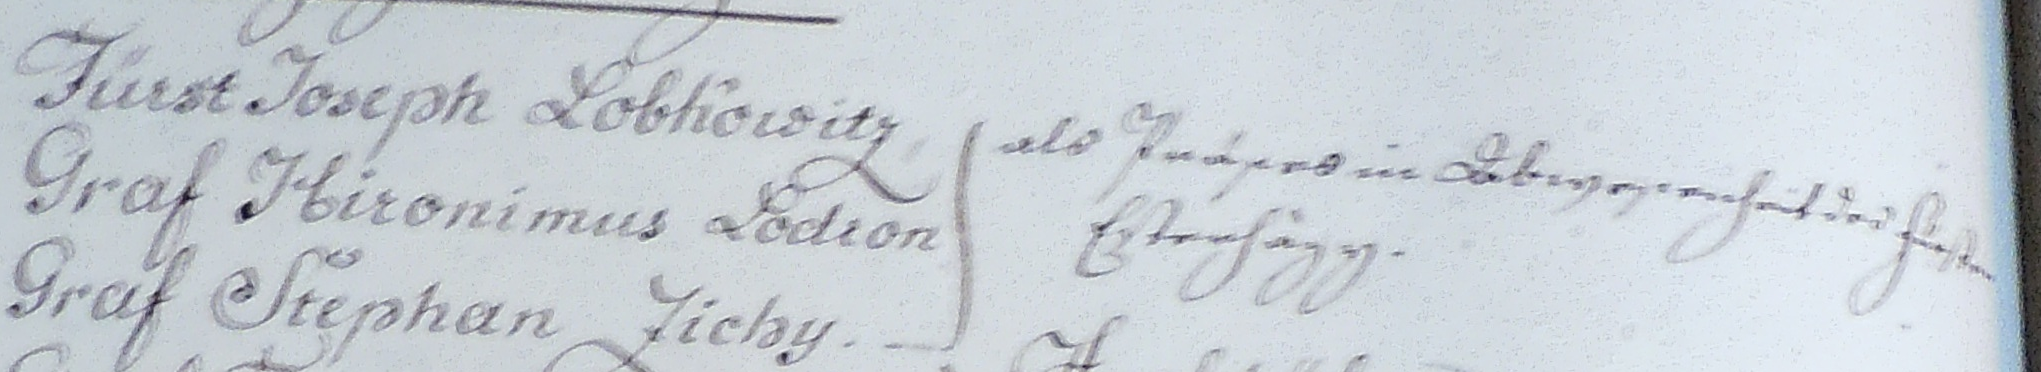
Fürst Joseph Lobkowitz als Präses in Abwesenheit des Fürsten
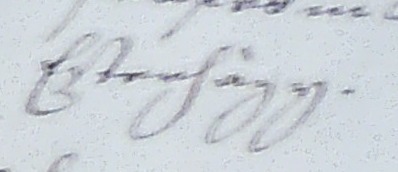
Esterhàzy.
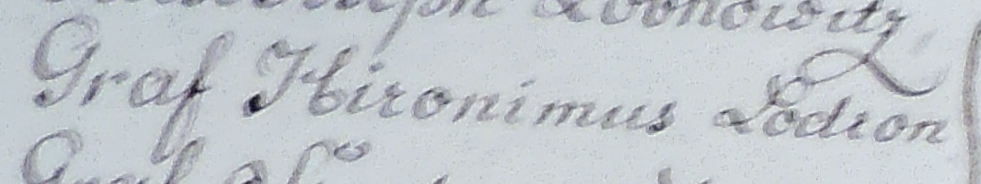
Graf Hironimus Lodron
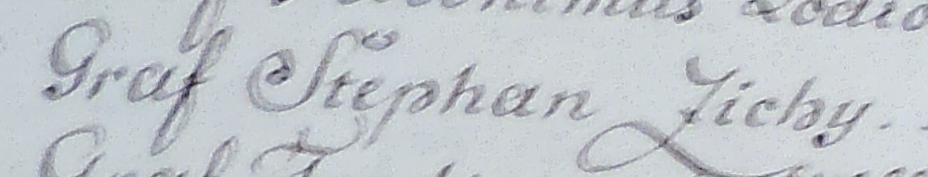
Graf Stephan Zichy.
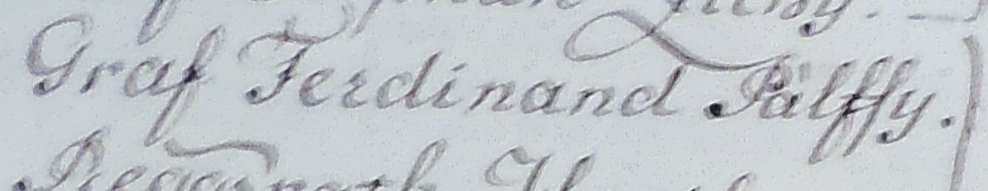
Graf Ferdinand Pàlffy.
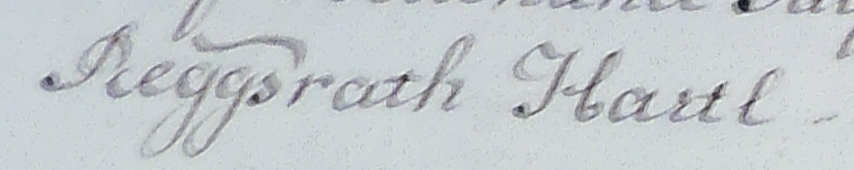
Reg͞gsrath Hartl
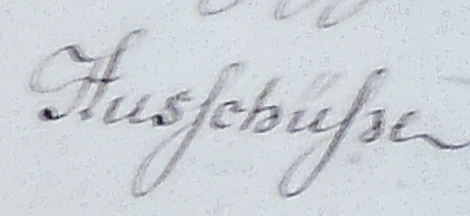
Ausschüsse
